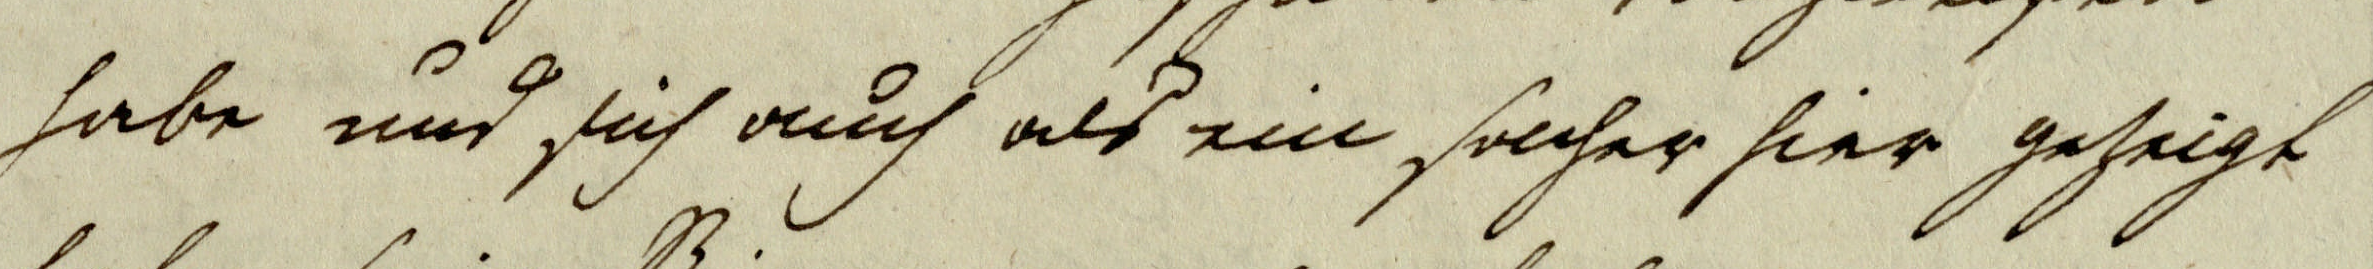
habe und sich auch als ein solcher hier gezeigt
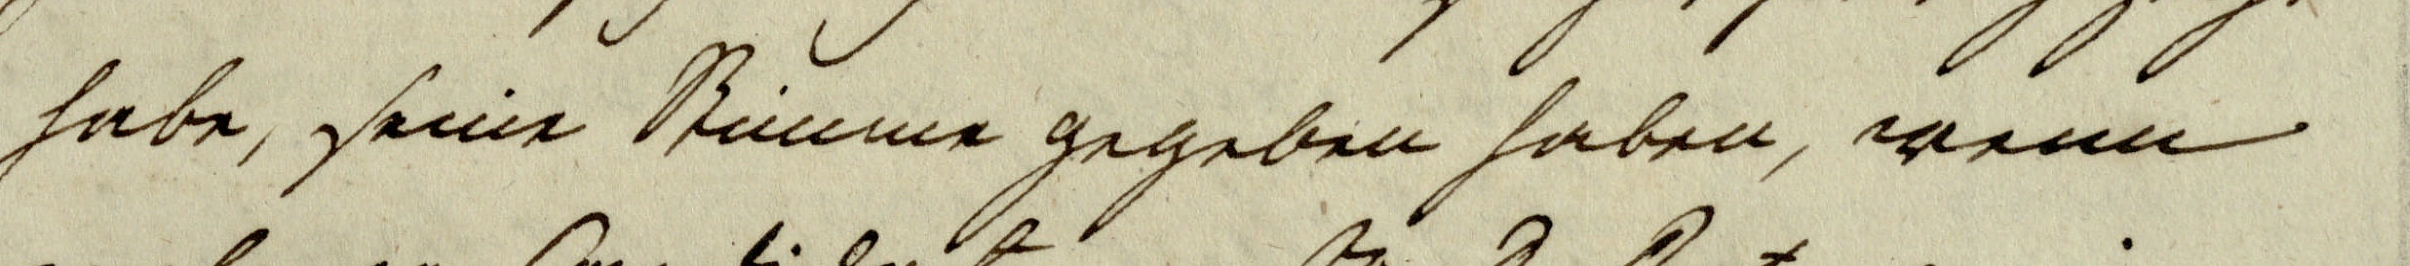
habe, seine Stimme gegeben haben, wenn
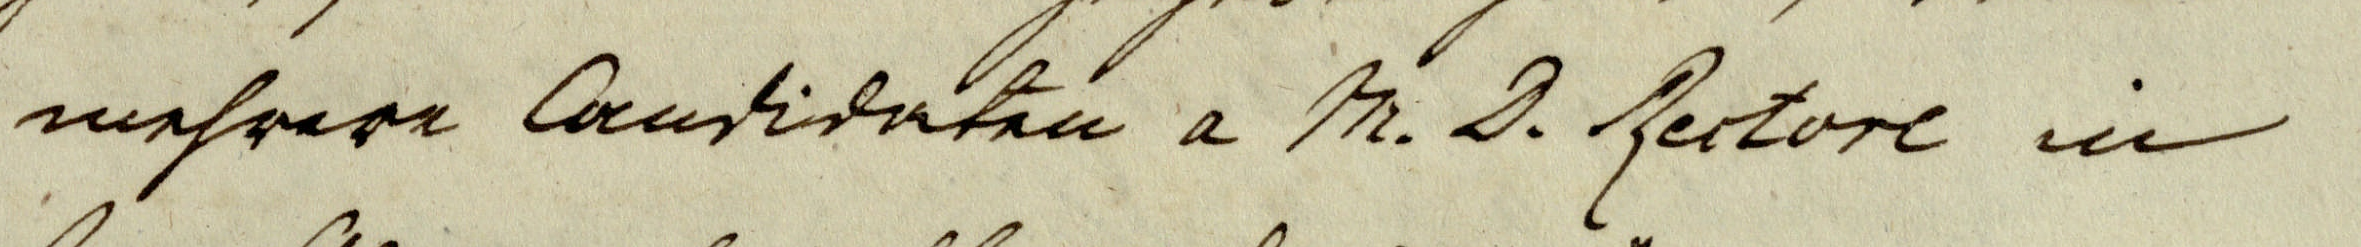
mehrere Candidaten a M. D. Rectore in
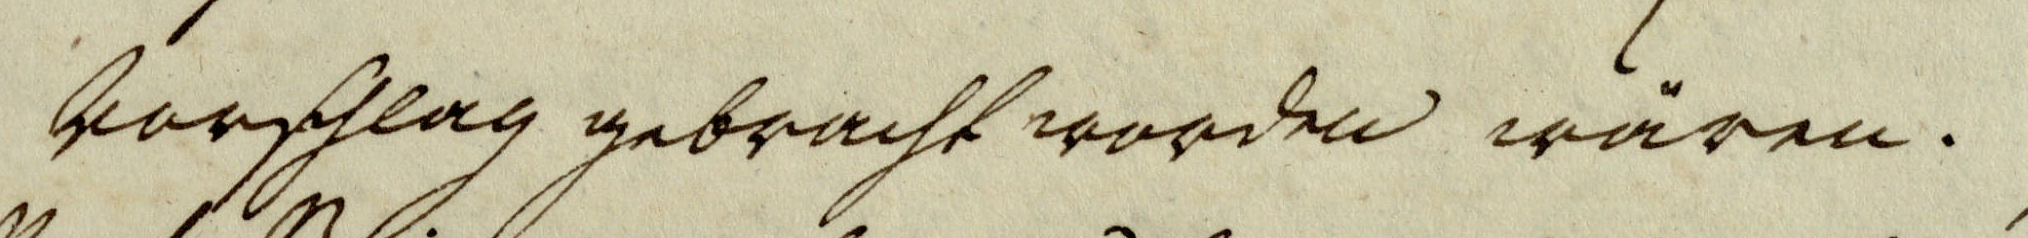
Vorschlag gebracht worden wären.
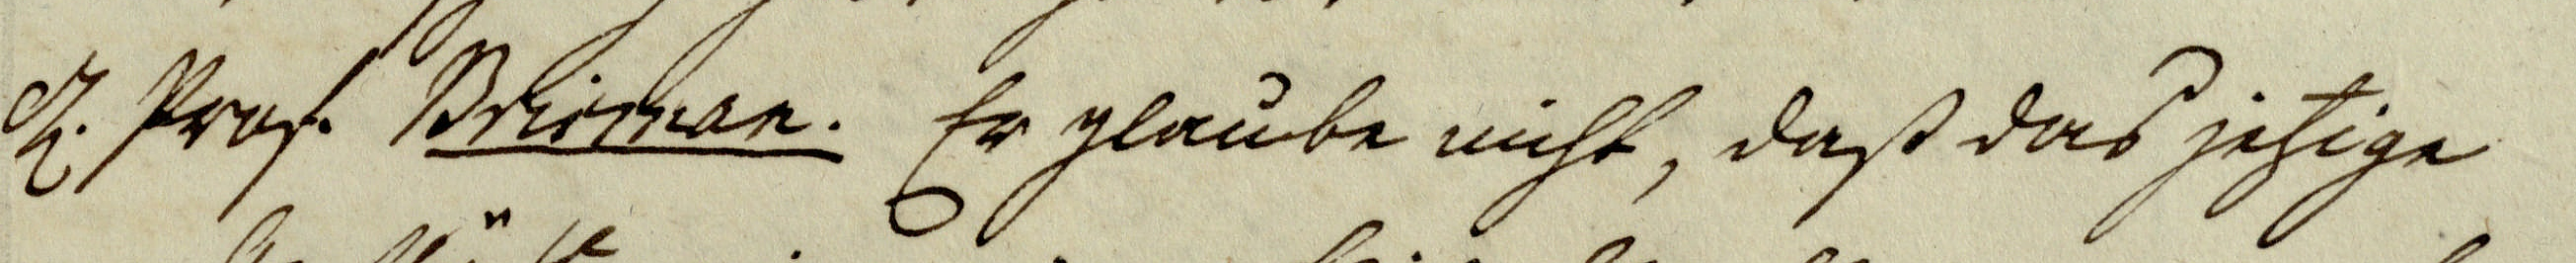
dh. Prof. Brisman. Er glaube nicht, daß das jetzige
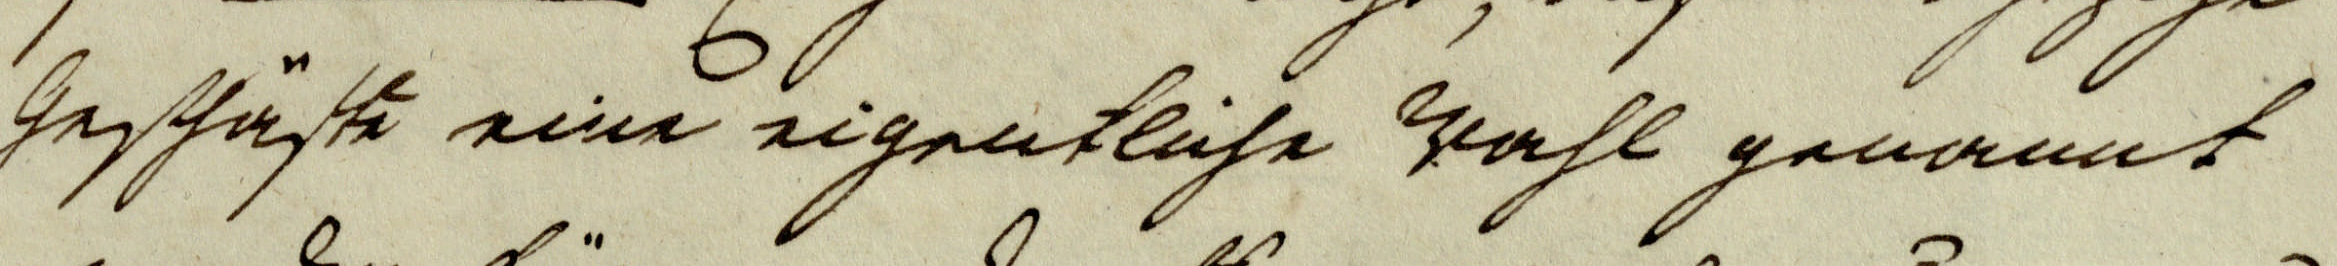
Geschäfte eine eigentliche Wahl genannt
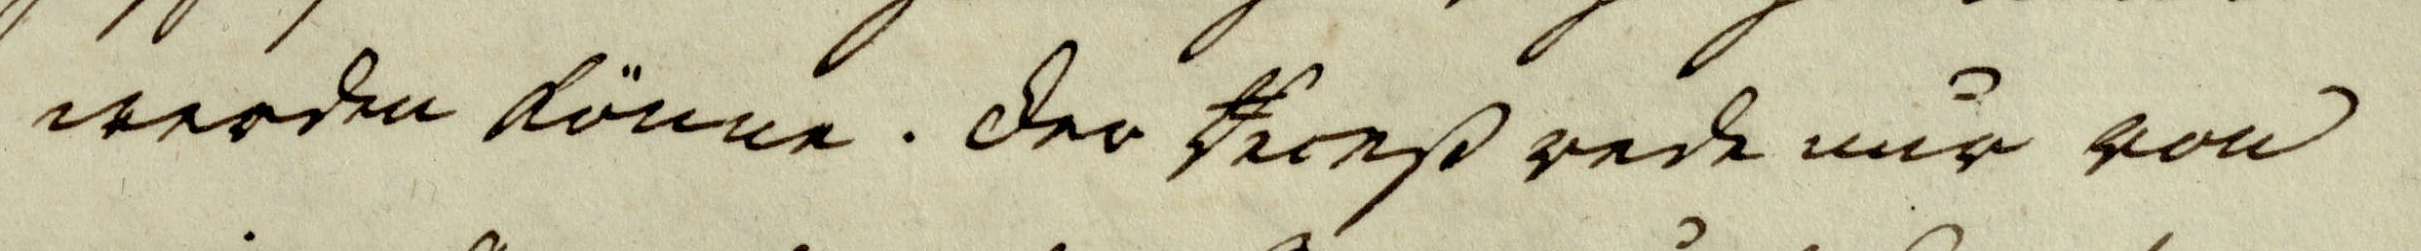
werden könne. Der Receß rede nur von
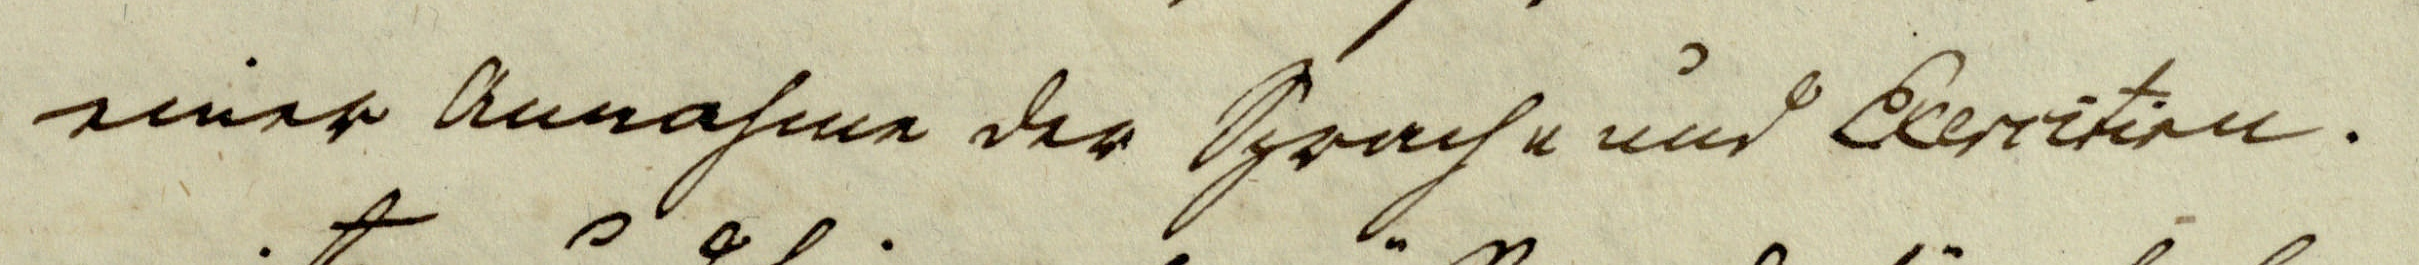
einer Annahme der Sprachen und Exercitien¬
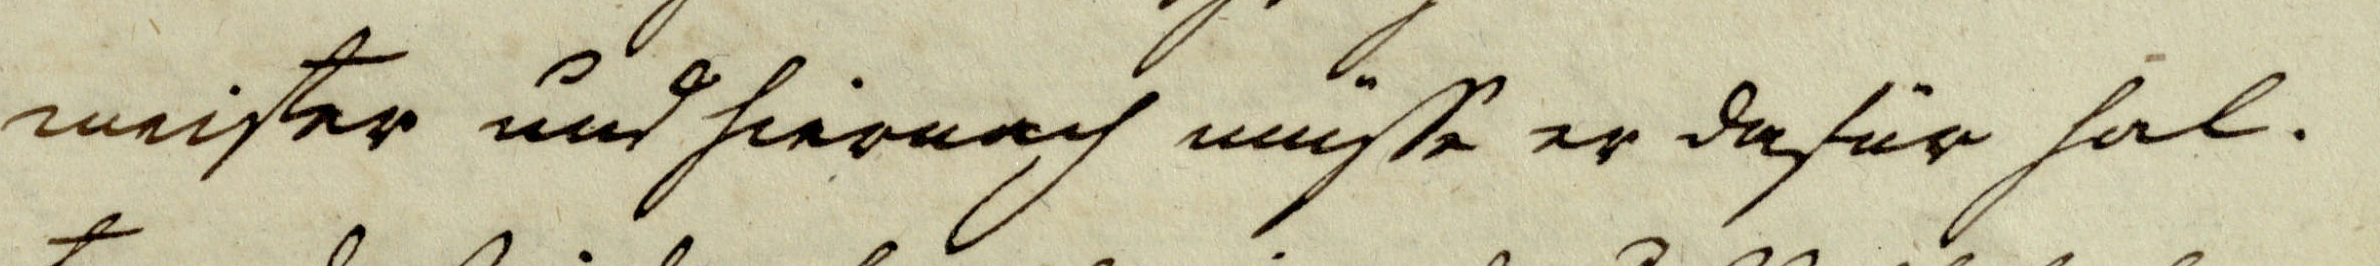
meister und hiernach müsse er dafür hal¬
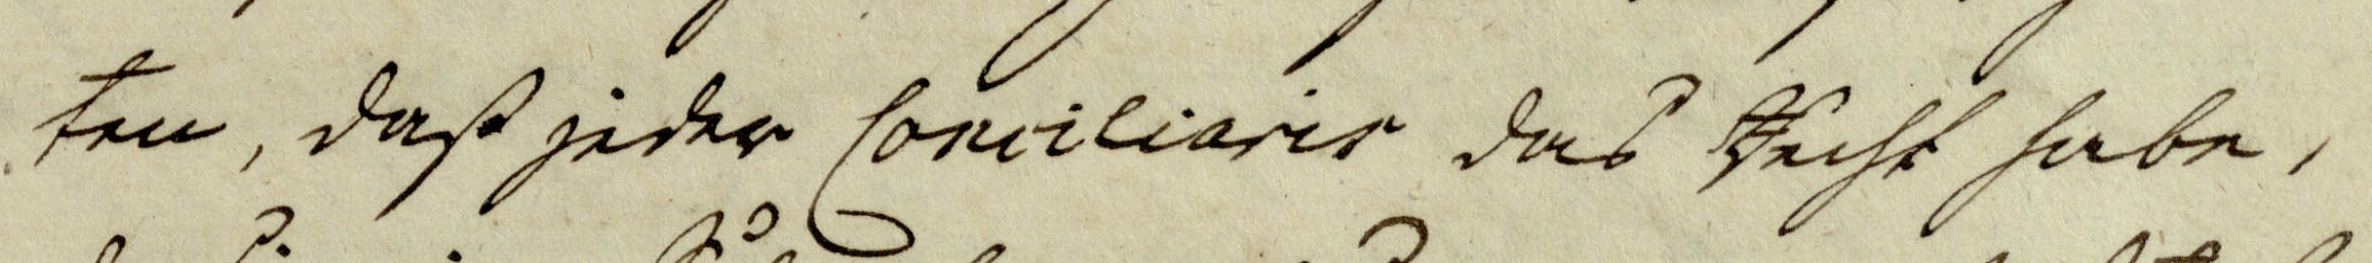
ten, daß jeder Conciliaris das Recht habe,
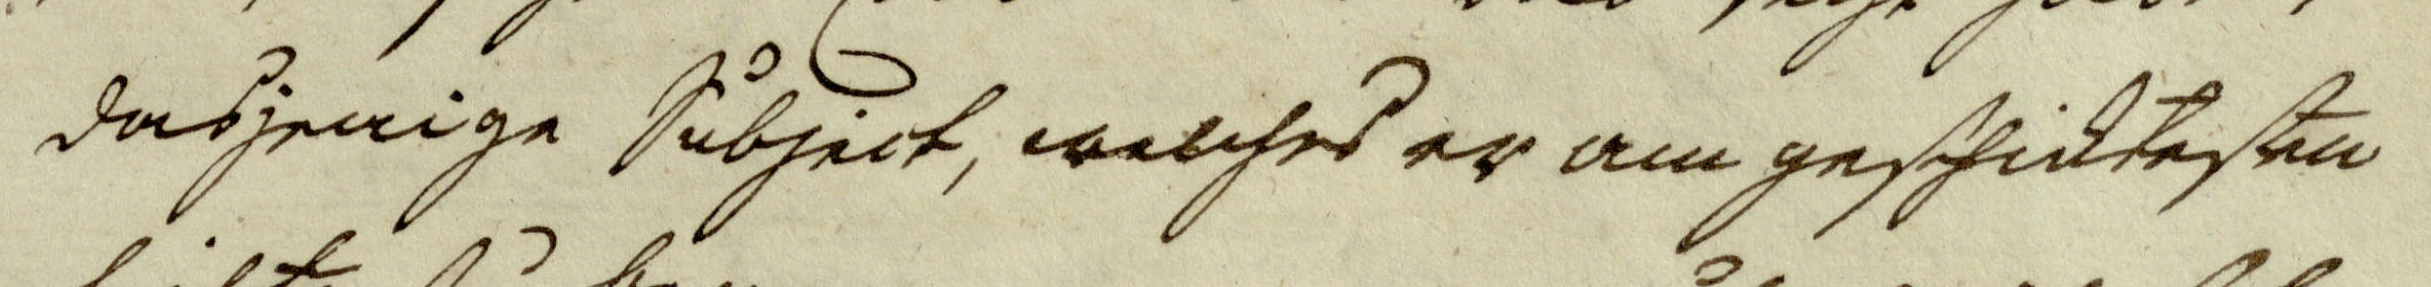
dasjenige Subject, welches er am geschicktesten
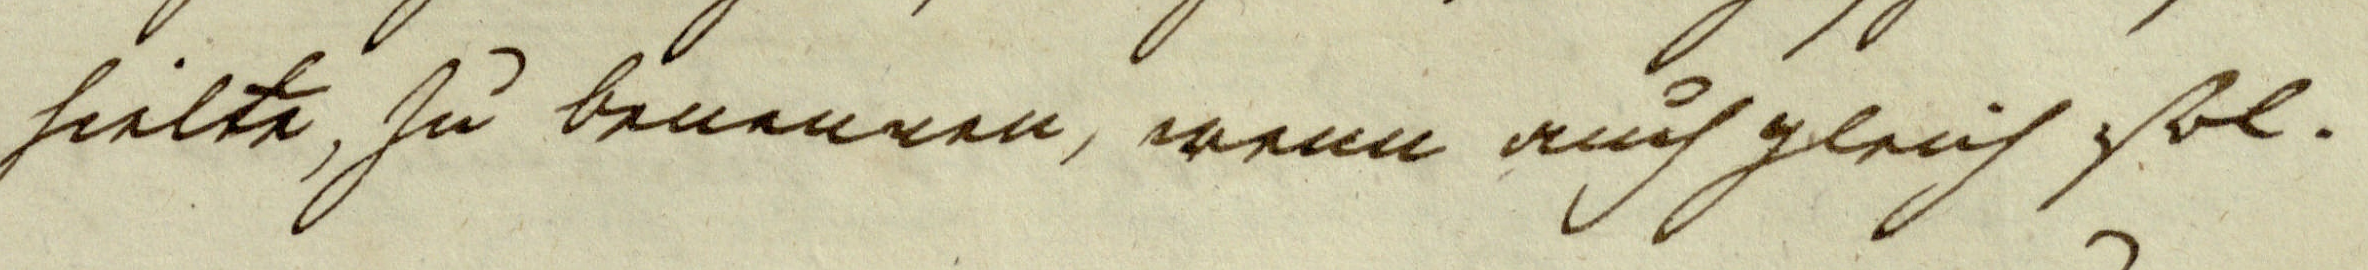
hielte, zu benennen, wenn auch gleich sol¬
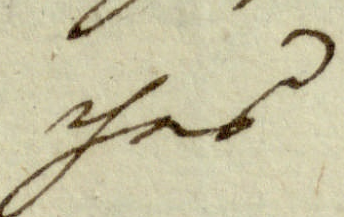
ches
